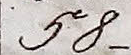58
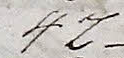42
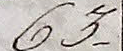63
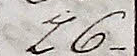26
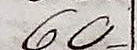60
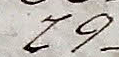29
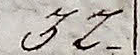32
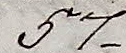57
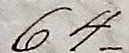64
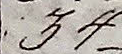34
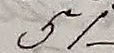51
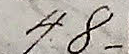48
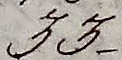33
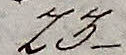23
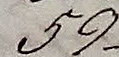59
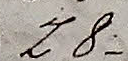28
